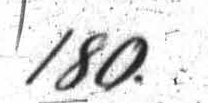180.
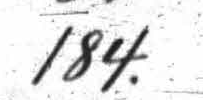184.
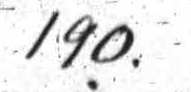190.
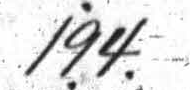194.
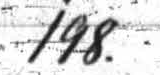198.
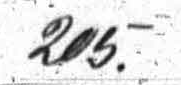205.
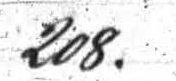208.
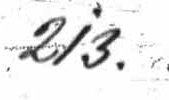213.
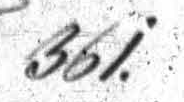361.
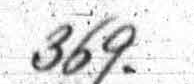369.
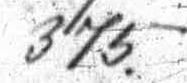375.
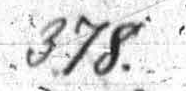378.
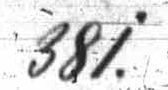381.
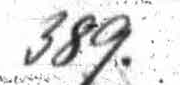389.
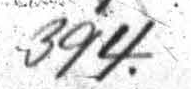394.
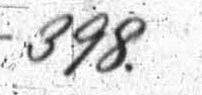398.
